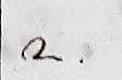2.
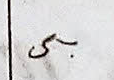5.
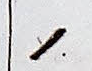1.
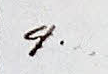4.
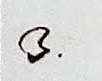3.
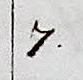7
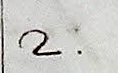2.
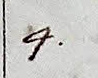4.
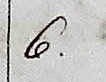6.
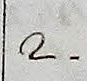2
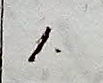1.
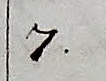7.
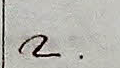2.
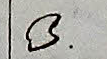3.
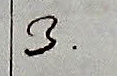3.
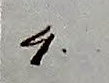4.
